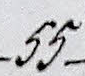55
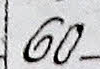60
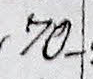70
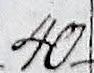40
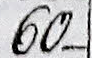60
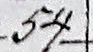54
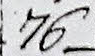76
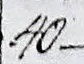40
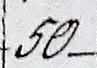50
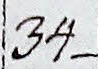34
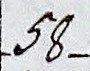58
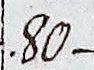80
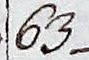63
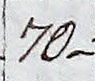70
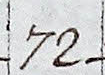72
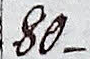80
